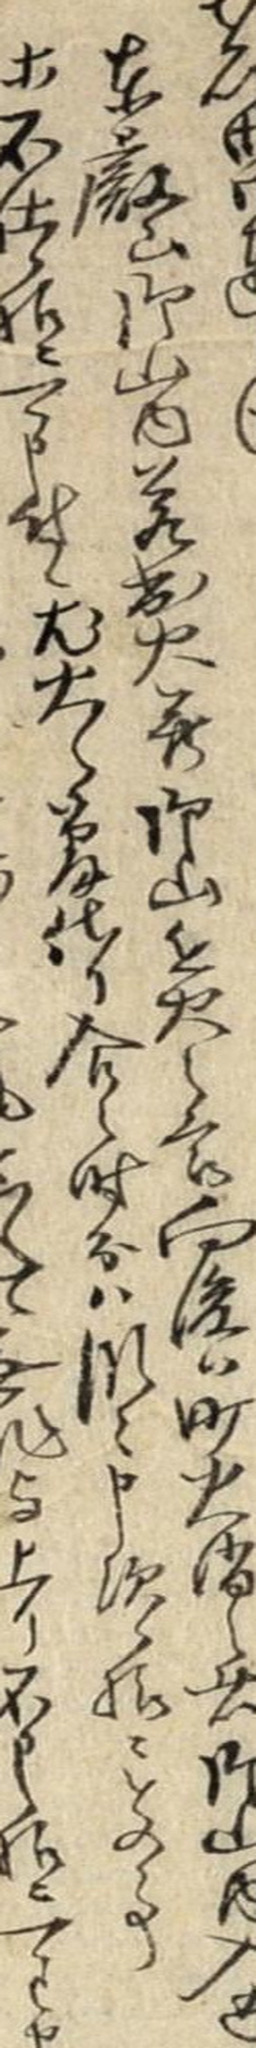等不仕候様に可申付候尤火之御番代り合之時分は段々申次候様にとの事
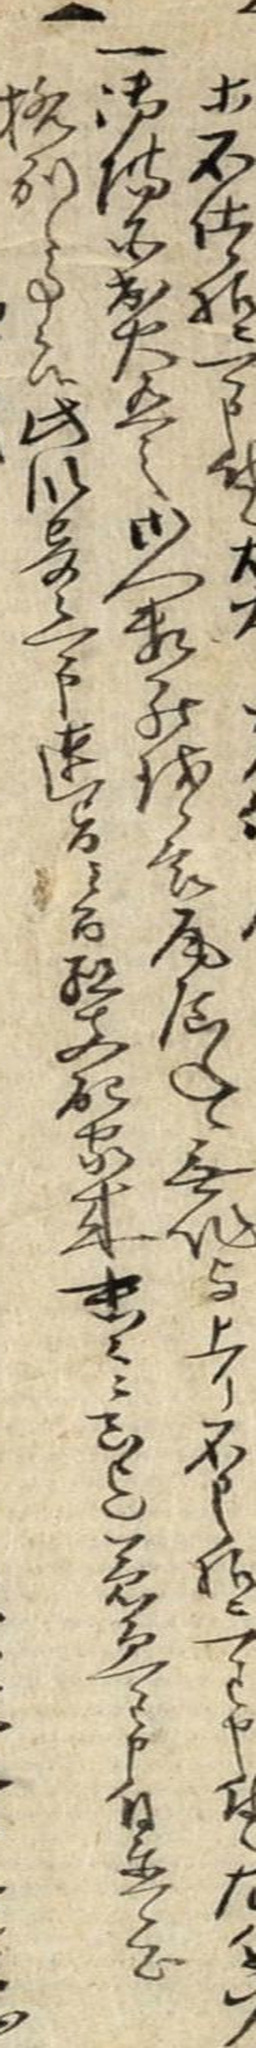格別之事に候此段寄々可申達旨に候間組支配家来末々に至迄兼て可被申付置候以上
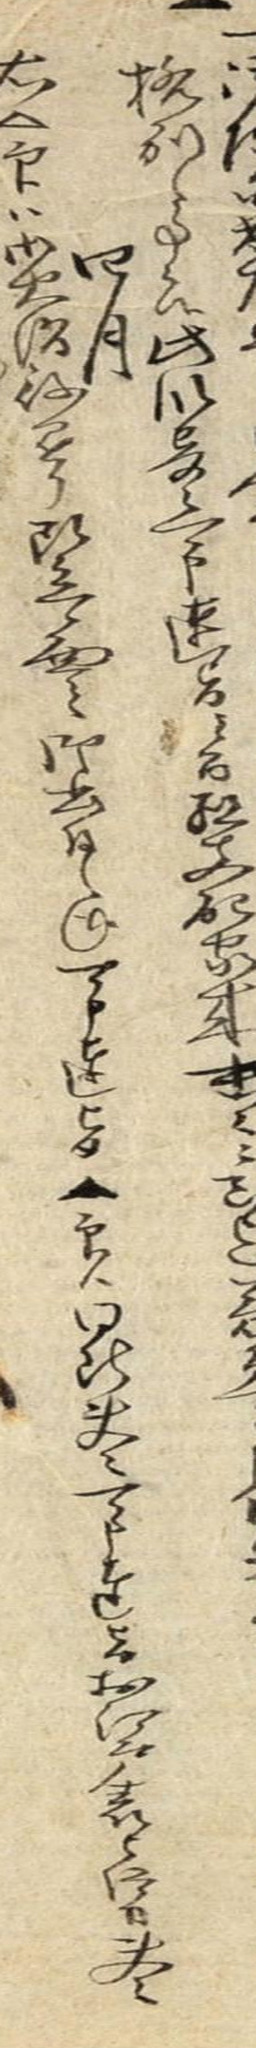右△印は御火消役懸り頭立候面々へ御書付之趣可申達旨▲印は同断夫々可申達旨於江戸表被仰付夫々
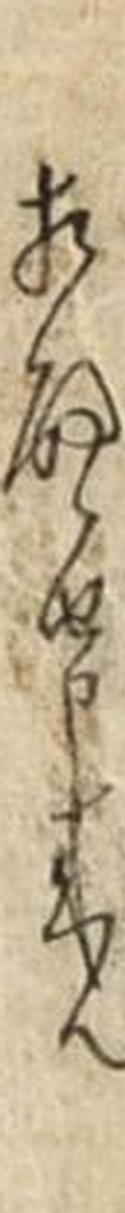相触候由申来る

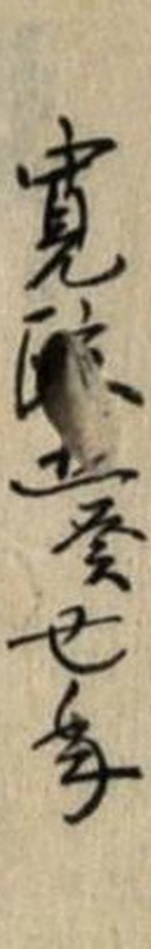寛政五癸丑年
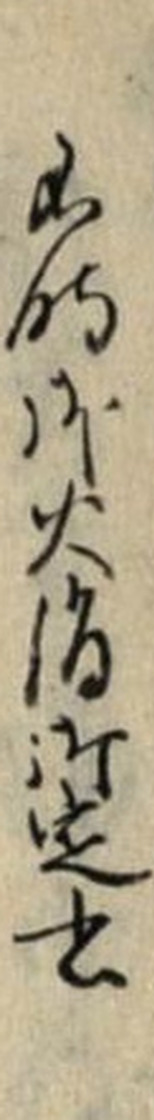不時御火消御定書定
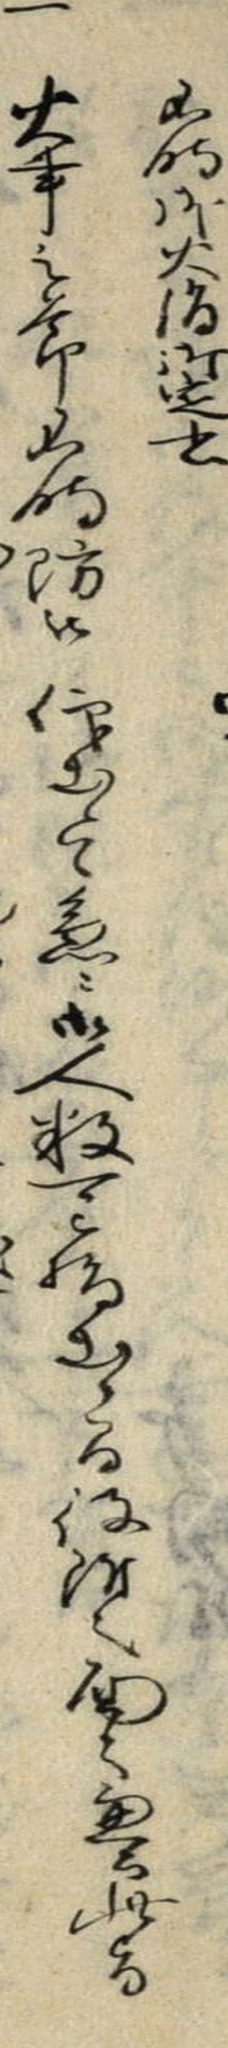一火事之節不時防被仰出候はゝ急に御人数可被指出候間役附之面々兼て此旨
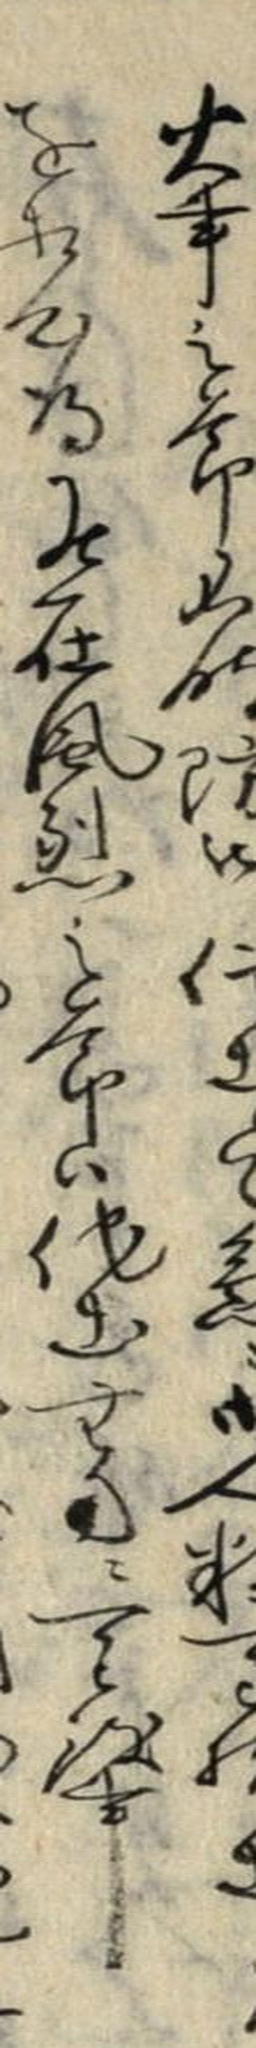を相心得罷在風烈之節は他出無用に可被致事
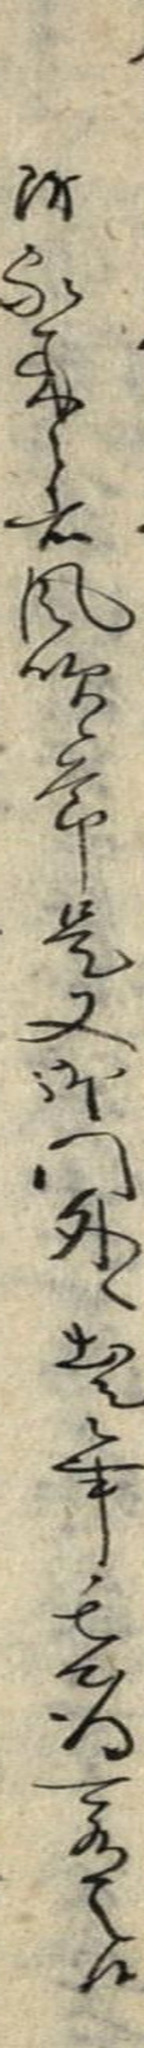附家来之者風吹候節是又御門外へ出し候事其心得可有之候
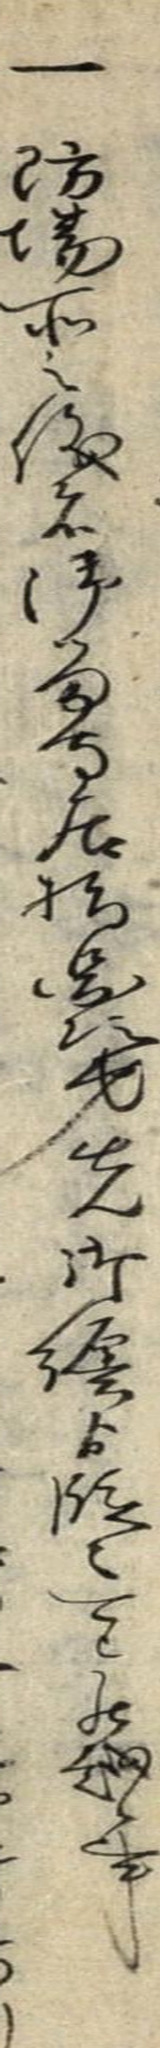一防場所之儀は御留守居指図次第先御纏ゟ段々可被罷越事
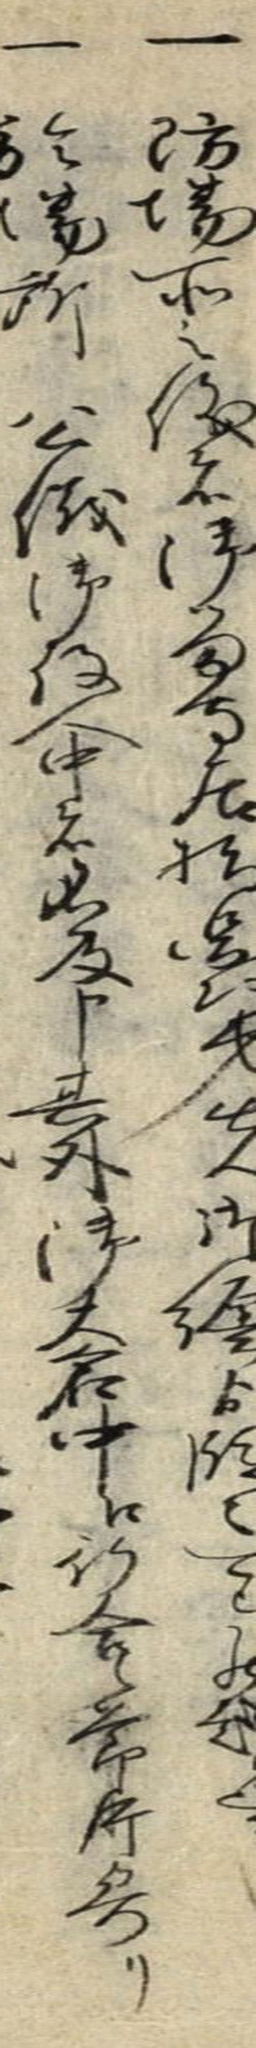一於場所公儀御役人中は不及申其外御大名中江行合候節片寄り
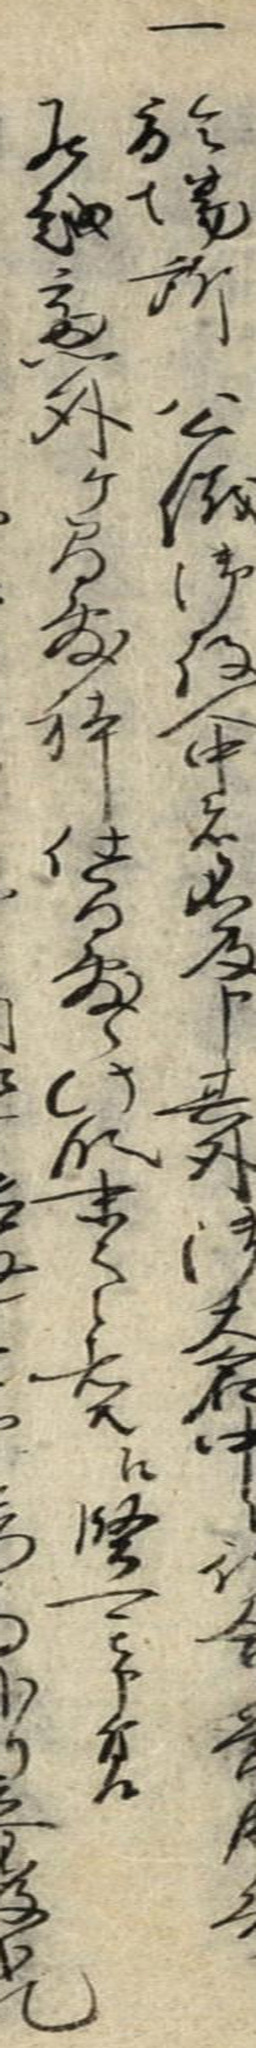罷越慮外ケ間敷体仕間敷候此段末々之者共江堅可被申付候
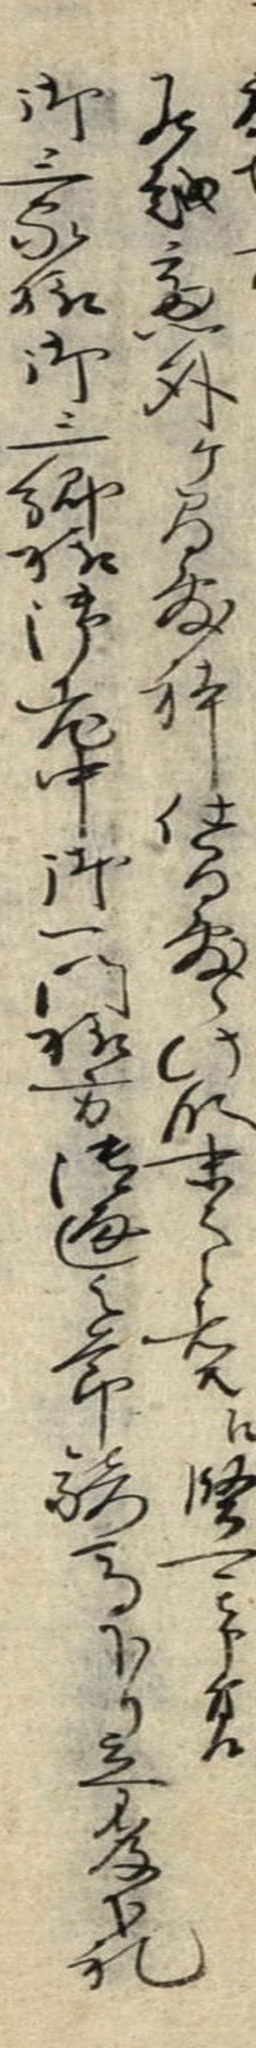御三家様御三卿様御老中御一門様方御通之節騎馬下り立不及下礼
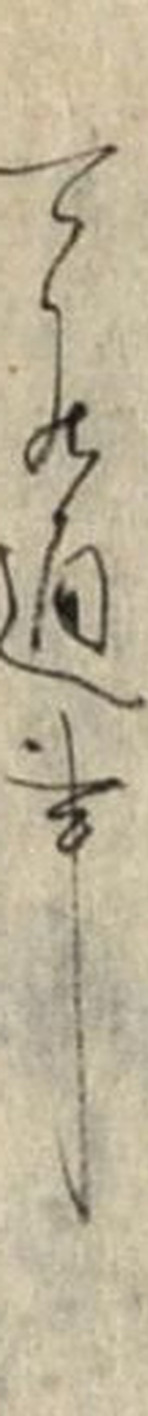可罷通事
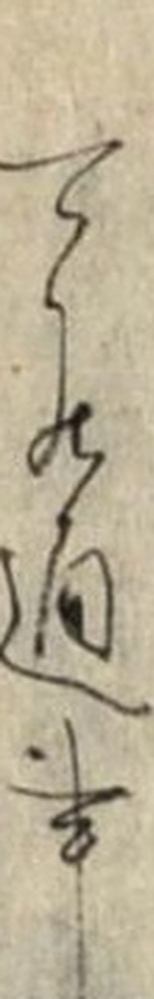可罷通事
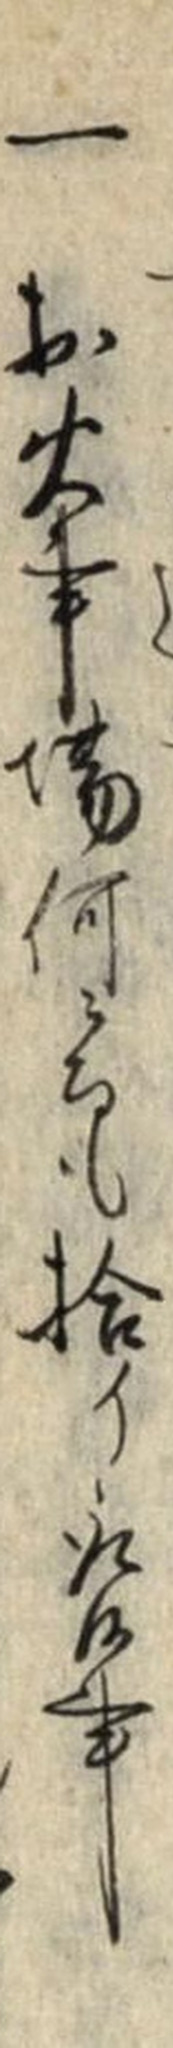一於火事場何にても拾い取候事
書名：三都并道中之部
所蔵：福井県文書館 Fukui Prefectural Archives
